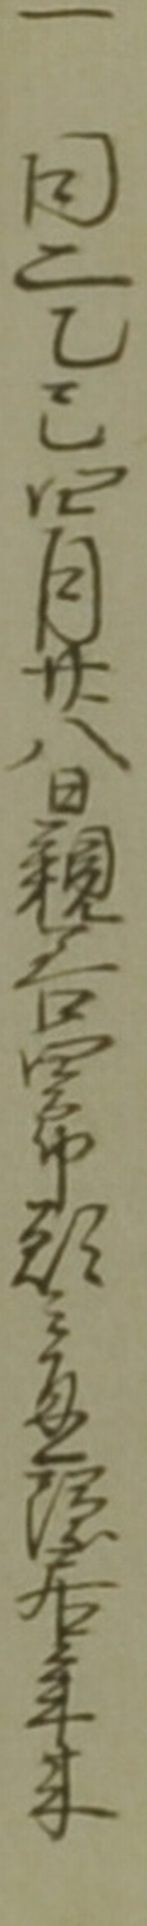一同二乙巳四月廿八日親善四郎願之通隠居年来
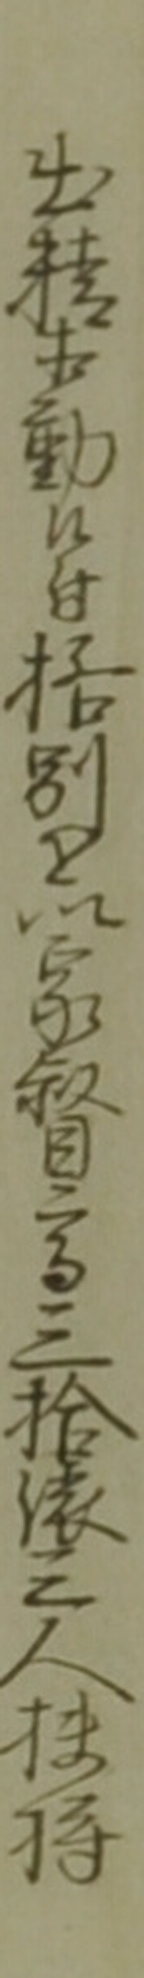出精相勤候付格別を以家督高三拾俵二人扶持
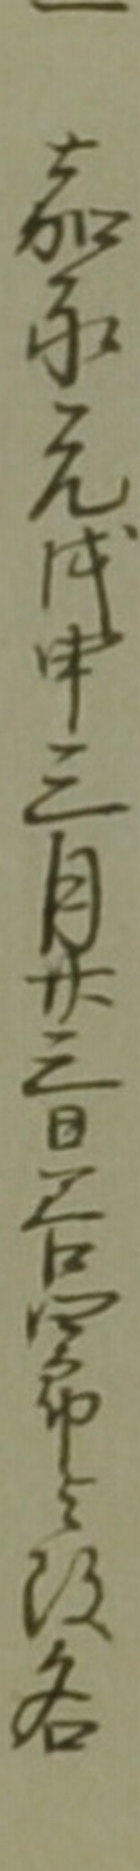一嘉永元戊申三月廿三日善四郎改名
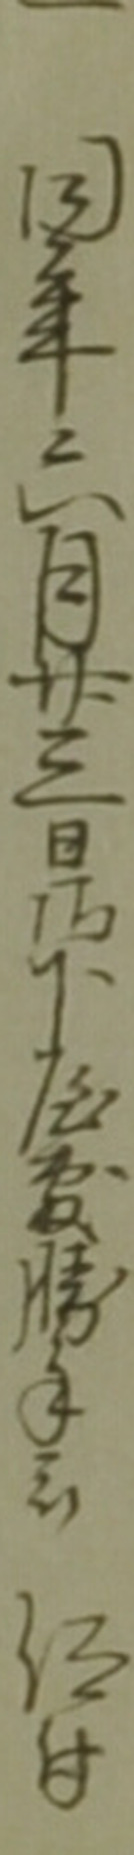一同年六月廿三日御下屋敷勝手被仰付
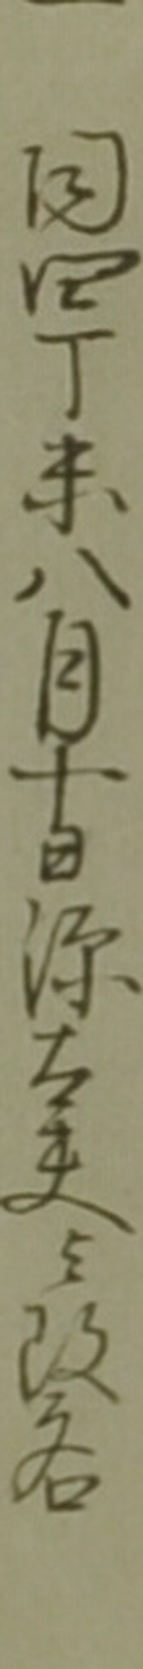一同四丁未八月十日源太夫改名
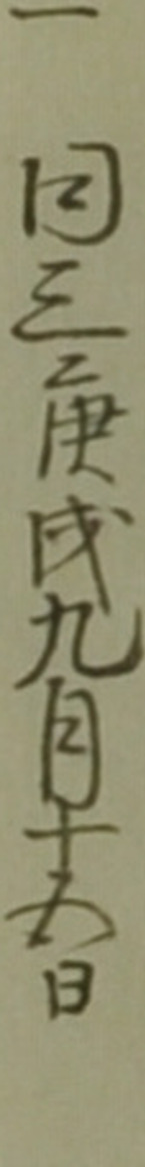一同三庚戌九月十五日

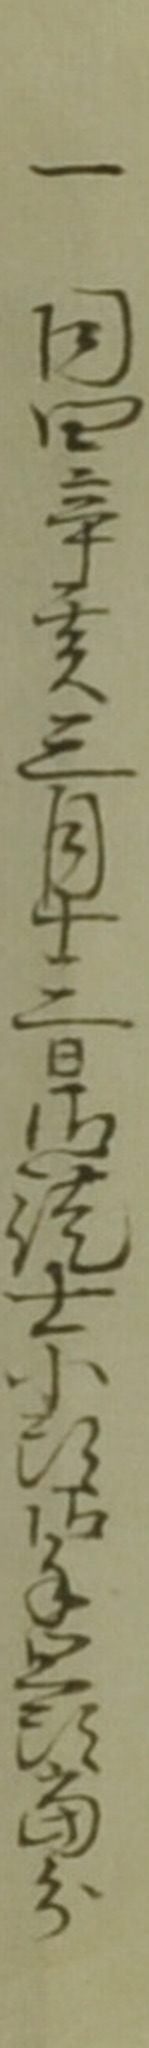一同四辛亥三月十三日御徒士小頭御手廻頭当分
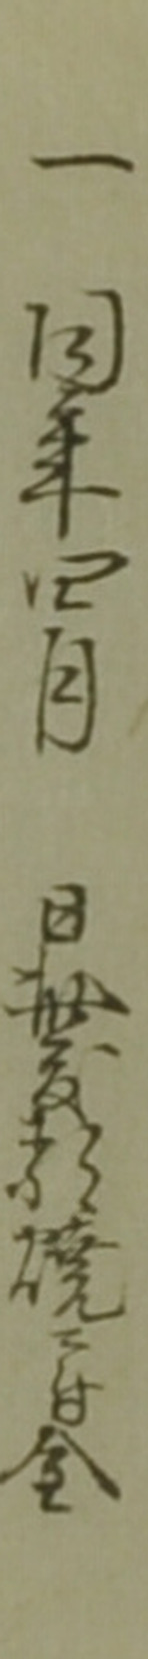一同年四月日此度類焼ニ付金
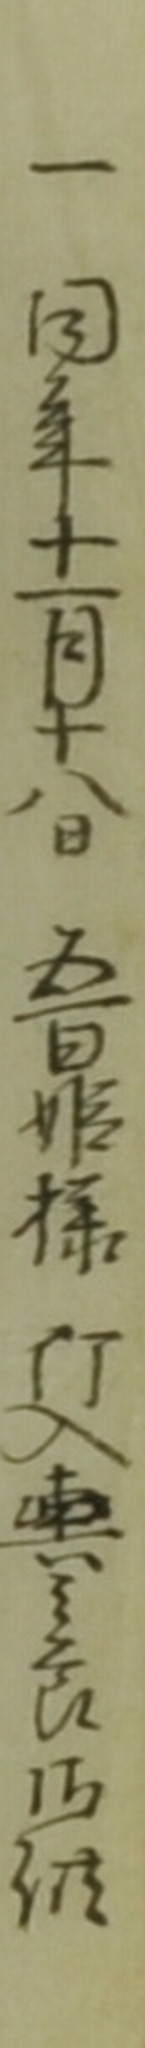一同年十一月十八日五百姫様御入輿之節御供
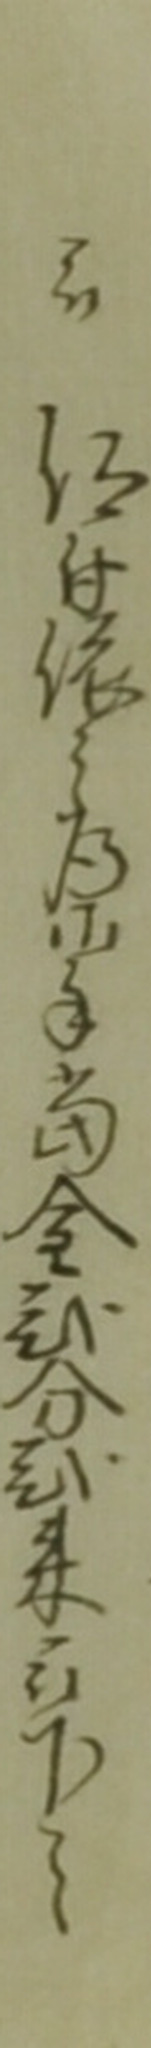被仰付依之為御手当金弐分弐朱被下之
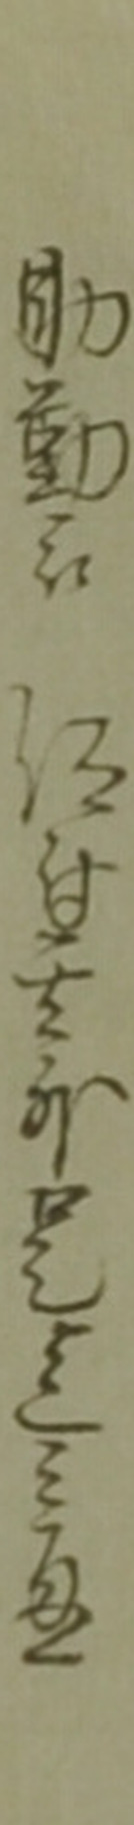助勤被仰付其外是迄之通
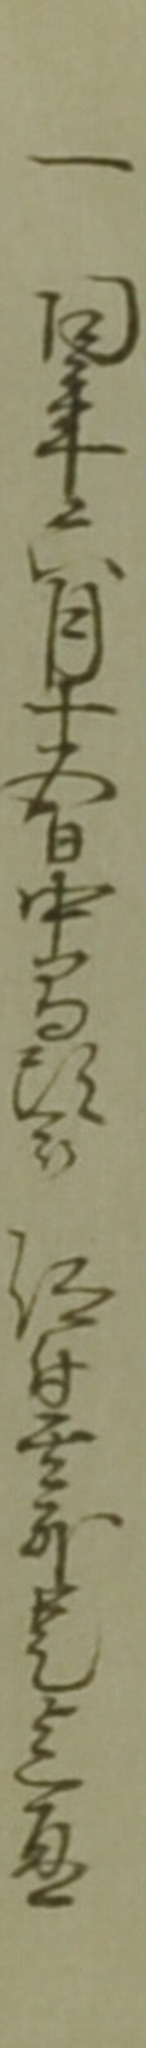一同年六月十五日中間頭被仰付其外是迄通
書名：無足廃家（弐）
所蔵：伊那市立高遠町図書館・合同会社AMANE
